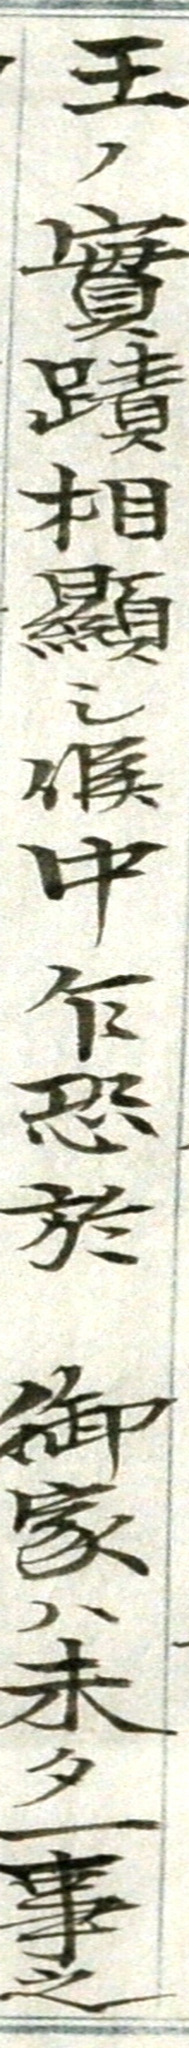王ノ実蹟相顕シ候中乍恐於御家ハ未タ一時之
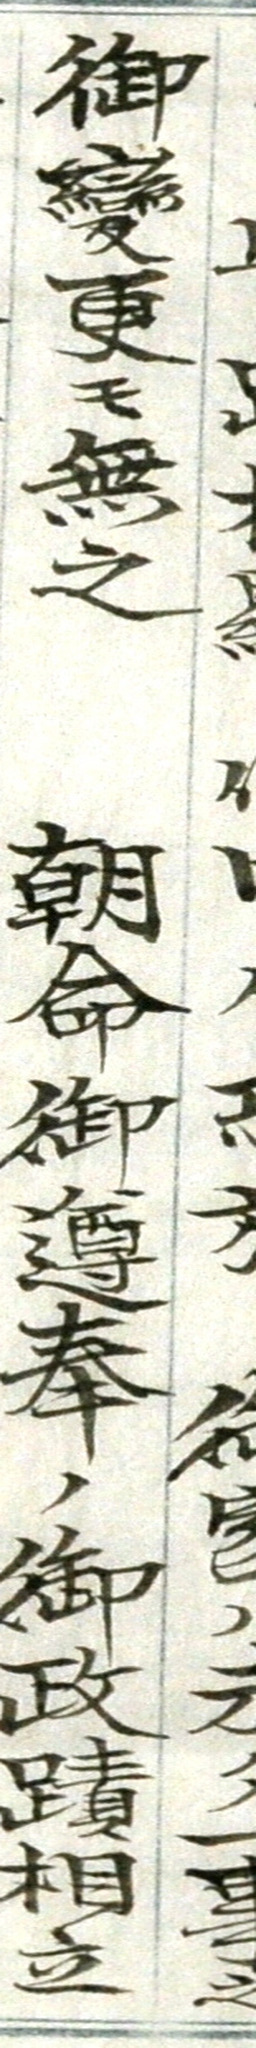御変更モ無之朝命御遵奉ノ御政蹟相立
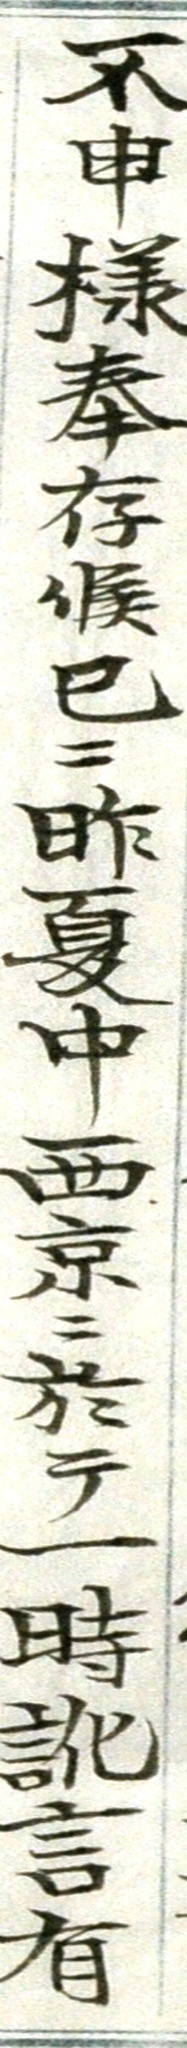不申様奉存候已ニ昨夏中西京ニ於テ一時訛言有
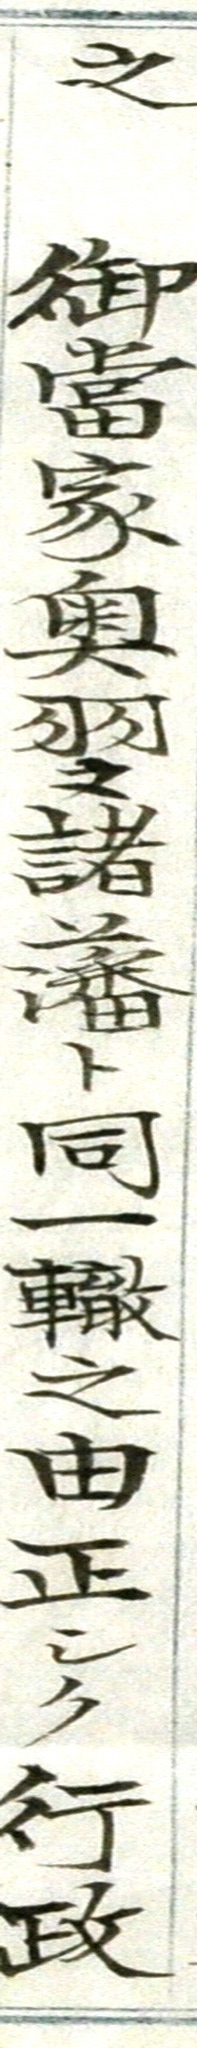之御当家奥羽之諸藩ト同一轍之由正シク行政
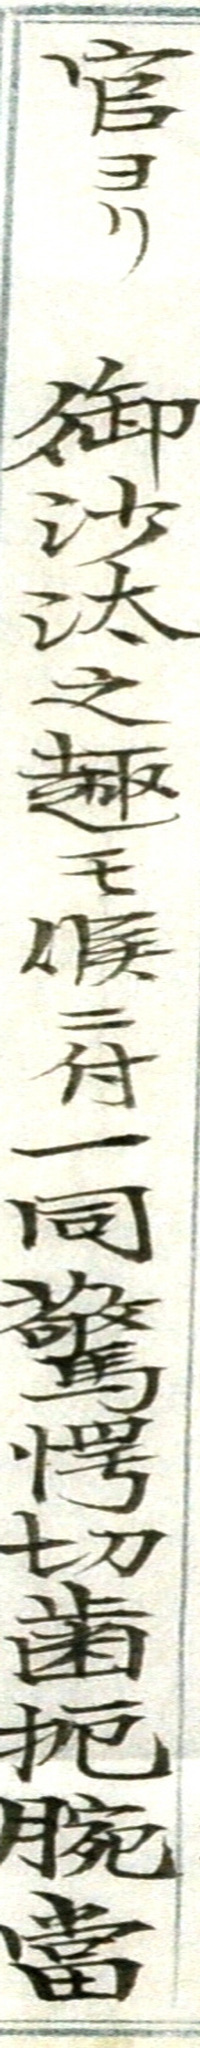官ヨリ御沙汰之趣モ候ニ付一同驚愕切歯扼腕当
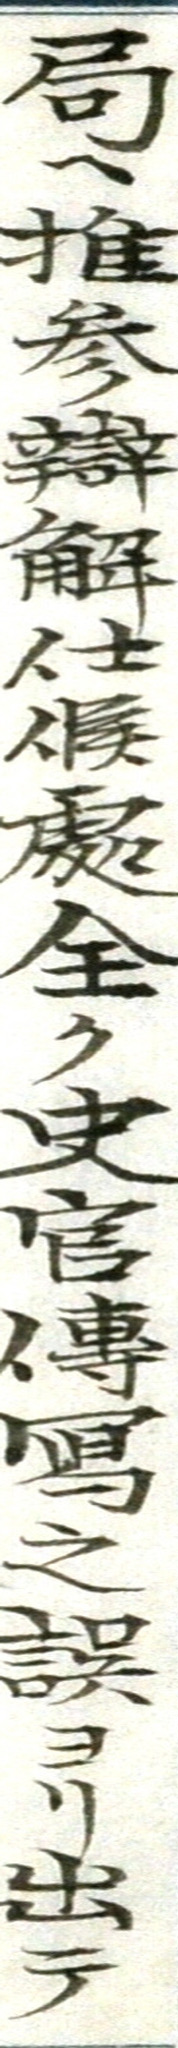局ヘ推参辨解仕候処全ク史官伝写之誤ヨリ出テ
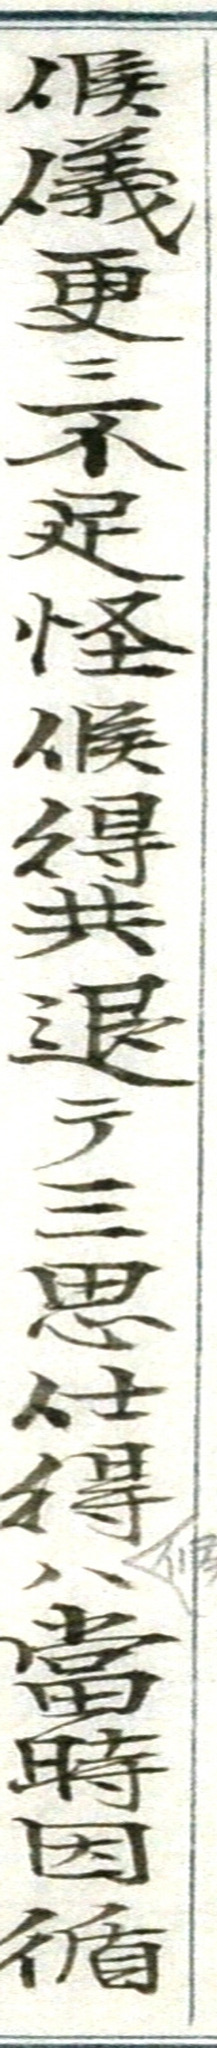候儀更ニ不足怪候得共退テ三思仕得候ハ当時因循
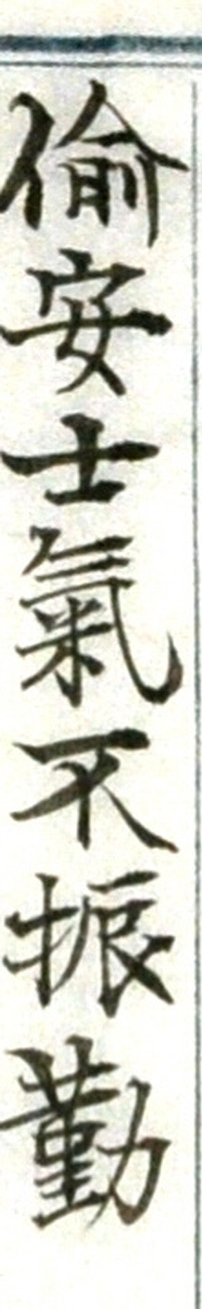偸安士気不振勤
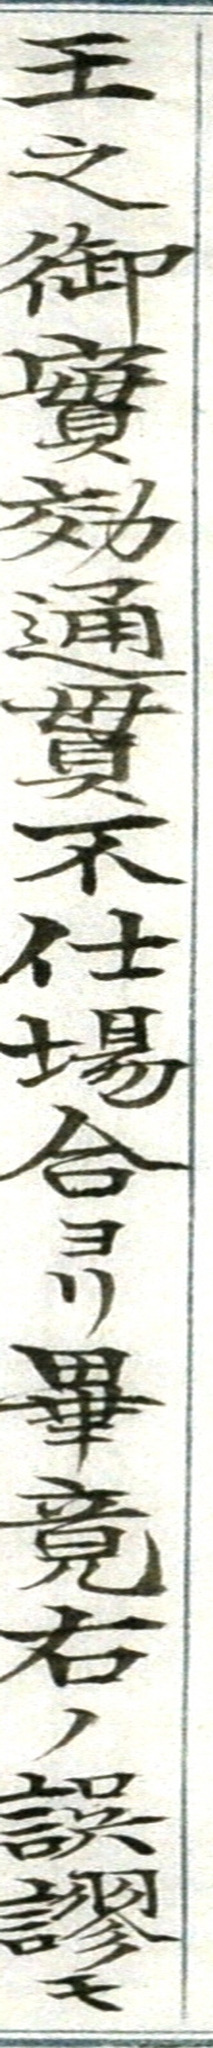王之御実効通貫不仕場合ヨリ畢竟右ノ誤謬モ
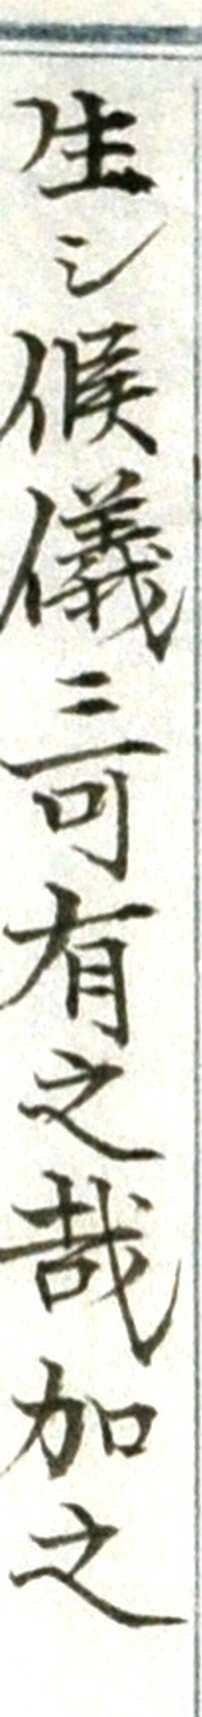生シ候儀ニ可有之哉加之
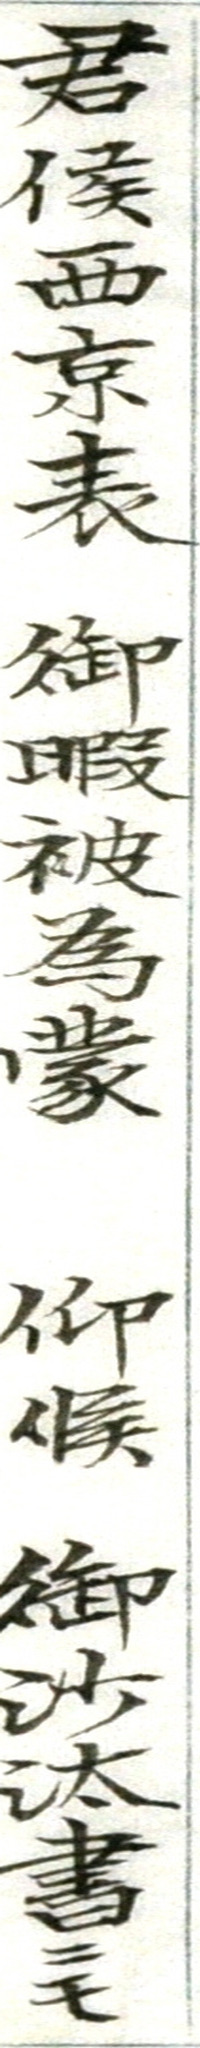君候西京表御暇被為蒙仰候御沙汰書ニモ
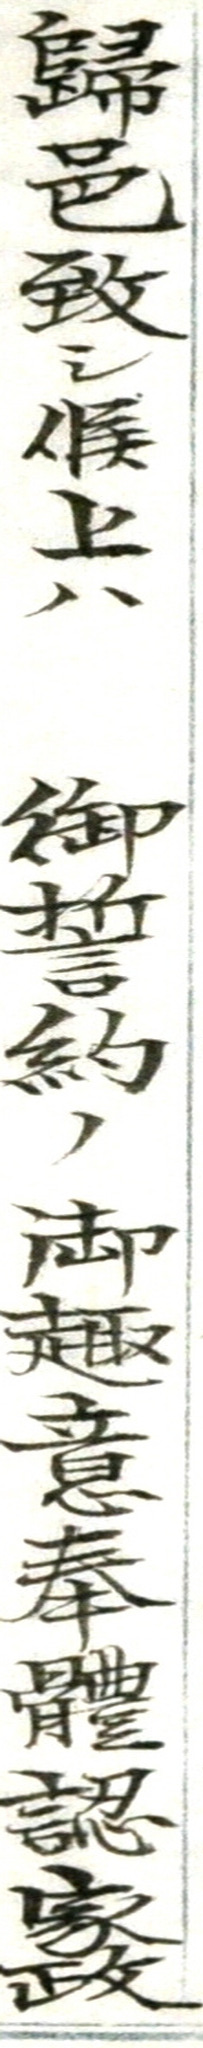帰邑致シ候上ハ御誓約ノ御趣意奉体認家政
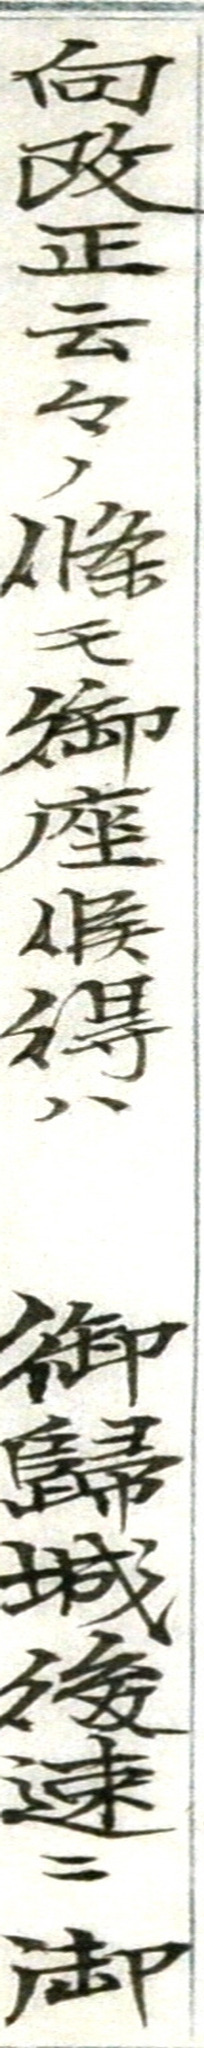向改正云々ノ條モ御座候得ハ御帰城後速ニ御
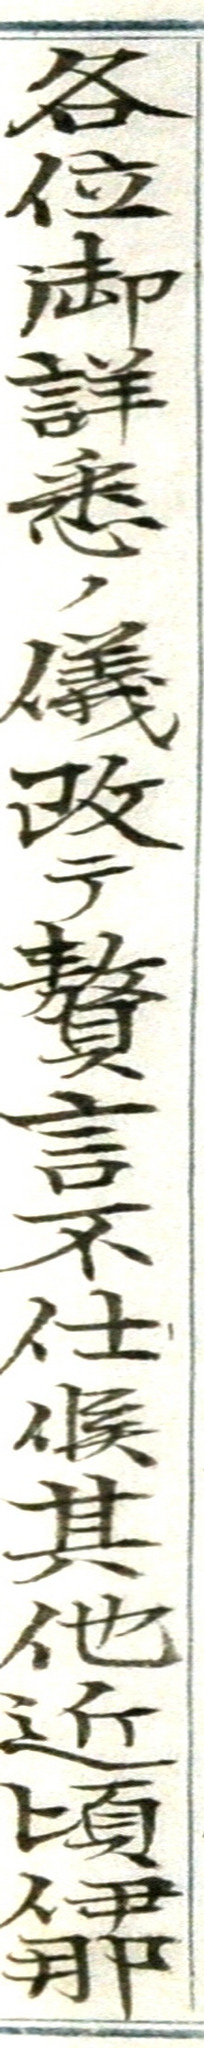各位御詳悉ノ儀改テ贅言不仕候其他近頃伊那

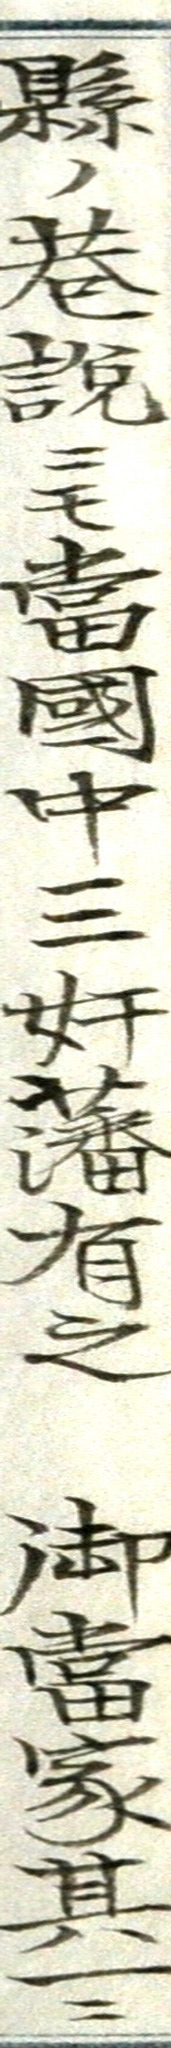県ノ巷説ニモ当国中三奸藩有之御当家其一ニ
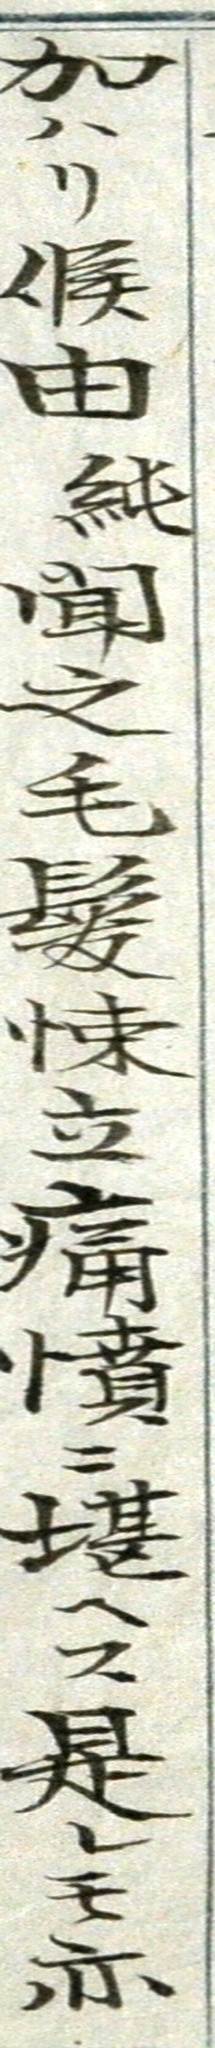加ハリ候由純聞之毛髪悚立痛憤ニ堪ヘス是レモ亦
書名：高遠藩執政ニ提出セシ建議書
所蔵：伊那市立高遠町図書館・合同会社AMANE
